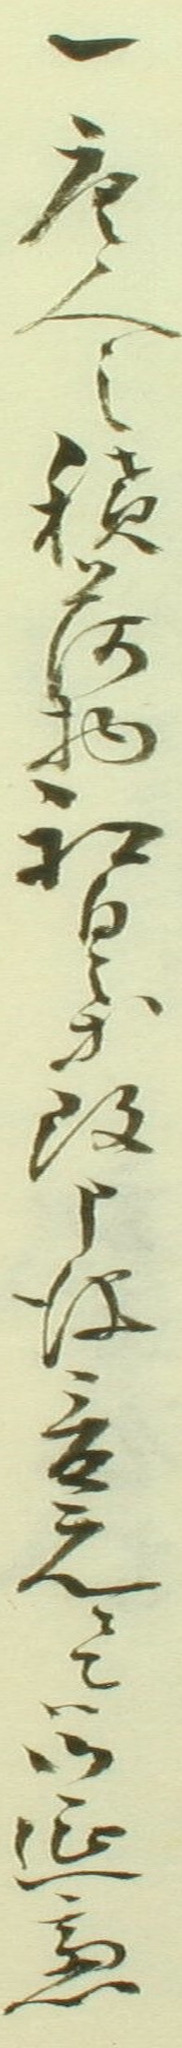一唐人之積荷物船具等改申儀爰元二てハ御延慮
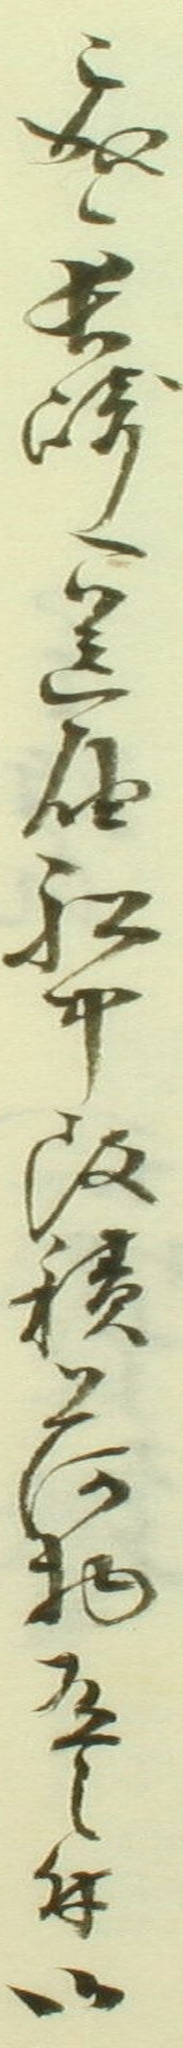被成候長崎へ送届船中改積荷物有之付御
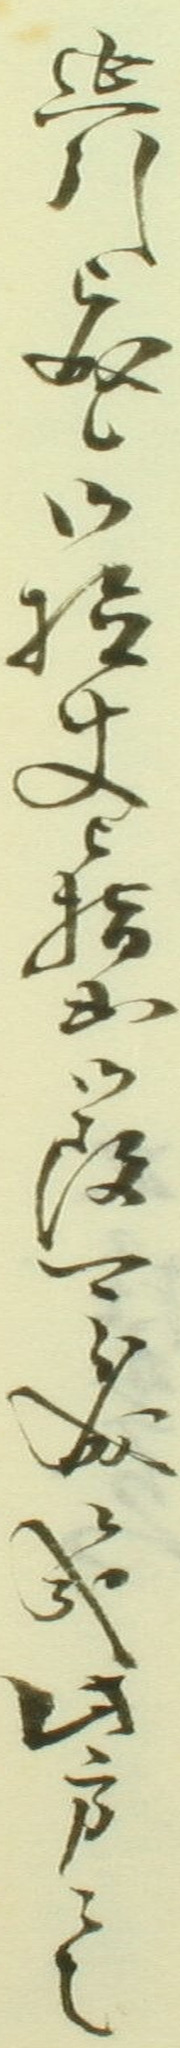延引被成候御検使被指出御改可被成候哉此方ニて
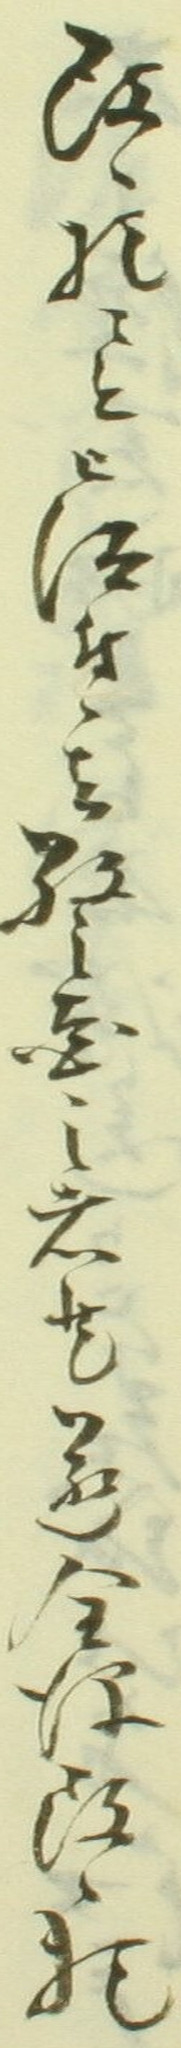改候様ニと被仰付候其警固之者共遂詮議改候様
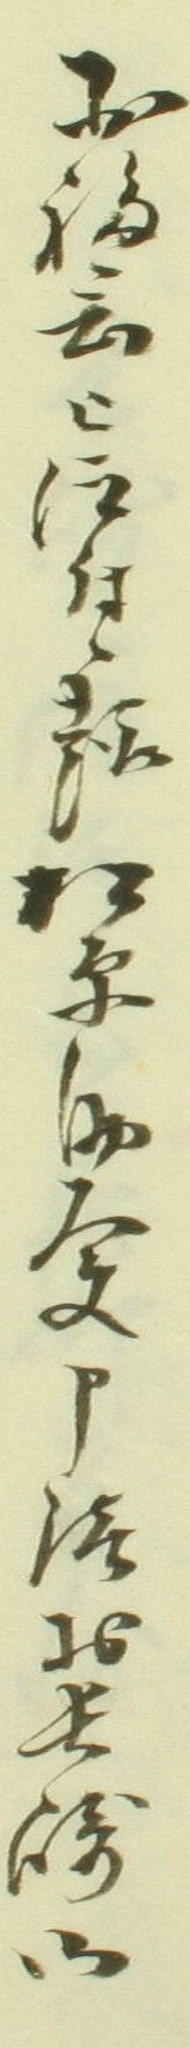於福岡被仰付候趣松原助大夫申談於長崎御
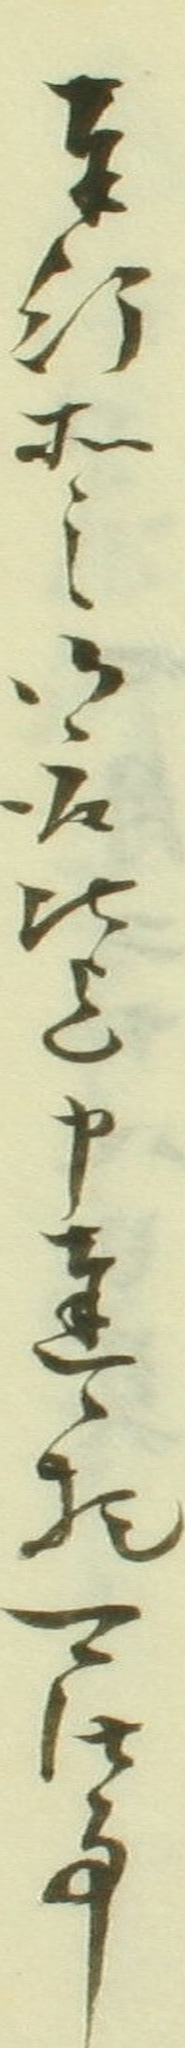奉行所之御取次迄申達候様可仕事
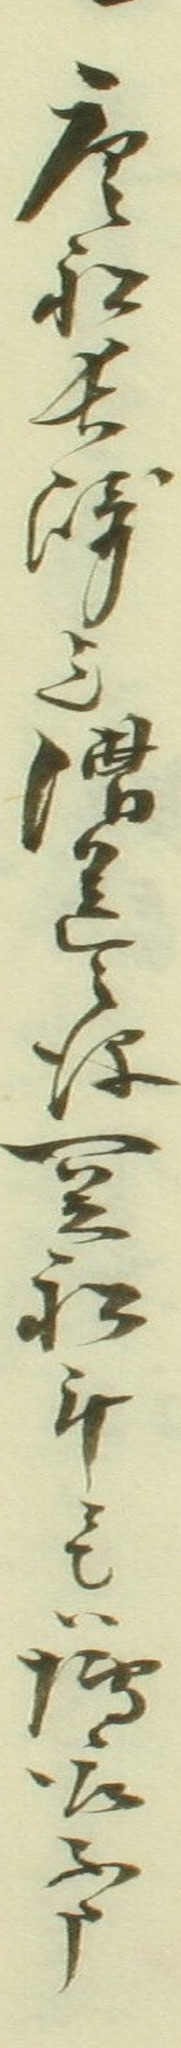一唐船長崎迄漕送之儀関船計ニてハ博取不申
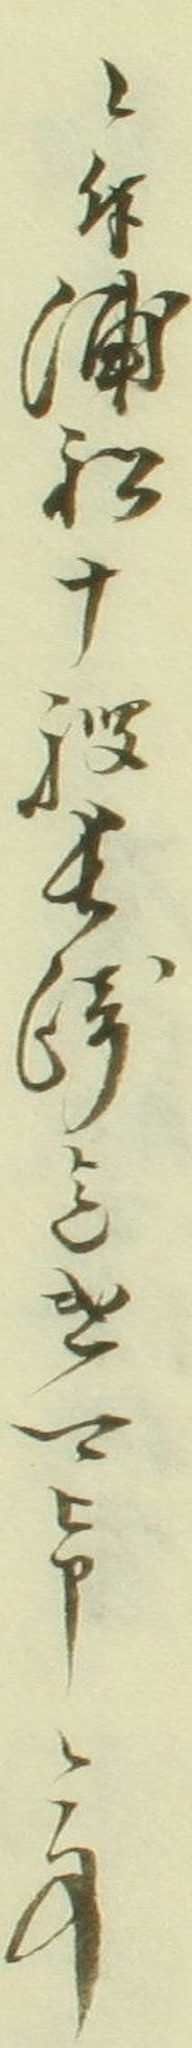ニ付浦船十艘長崎迄遣可被申候事
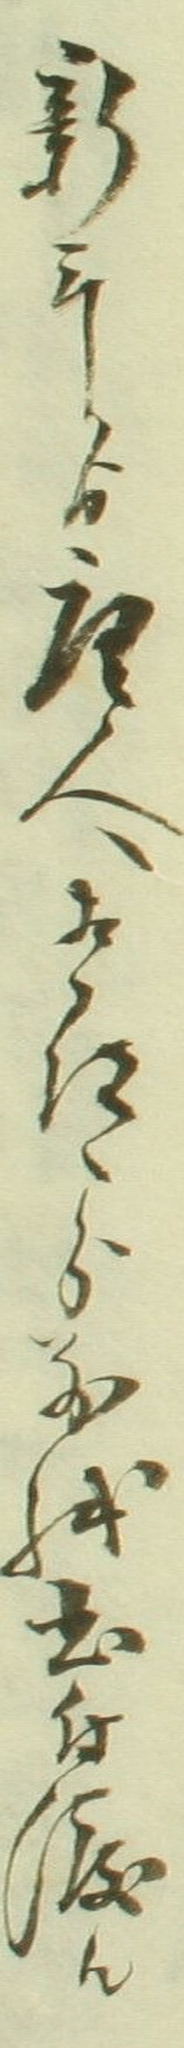新平ゟ唐人へ相尋候分別紙書付渡ル
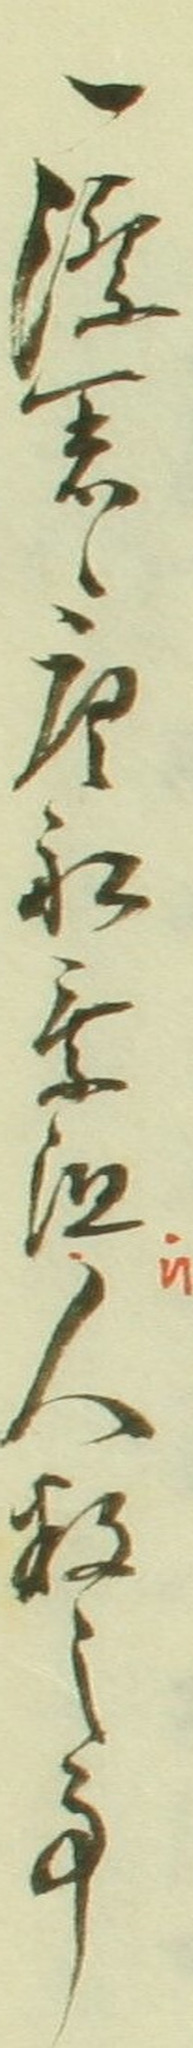一漂着候唐船乗組人数之事一
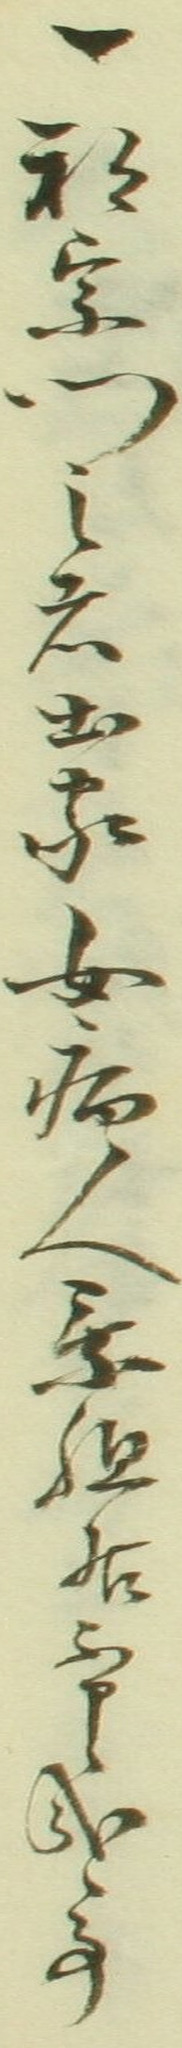一邪宗門之者出家女病人乗組居不申候哉候事
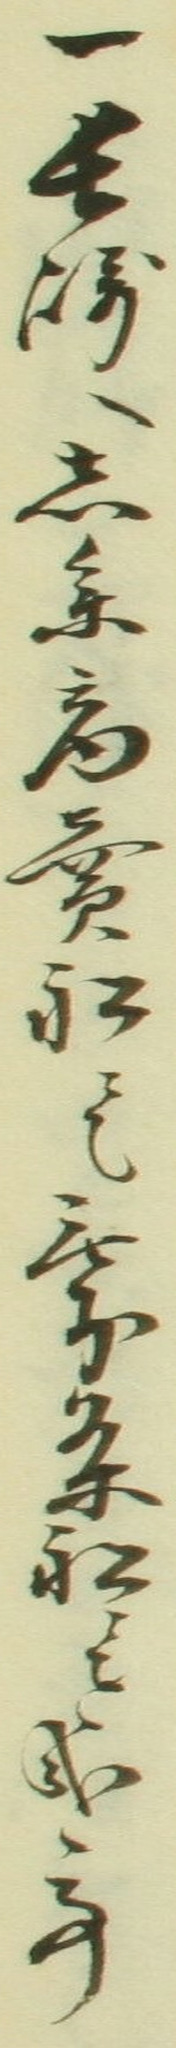一長崎へ志参商売船ニて無別条船ニて哉候事

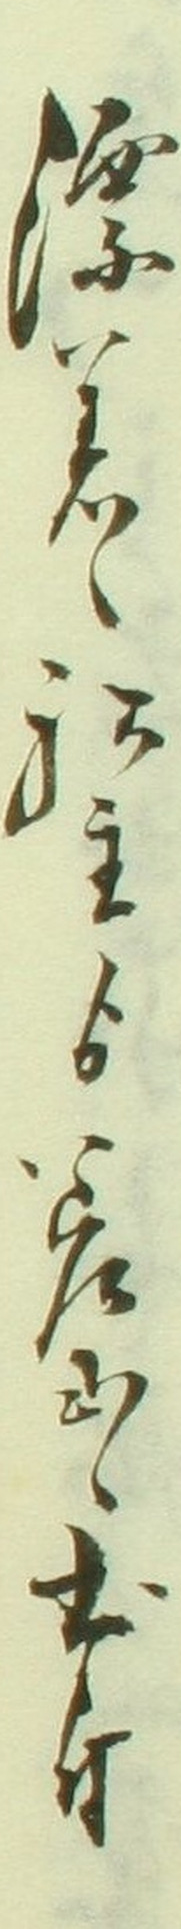漂着候船主ゟ指出候書付
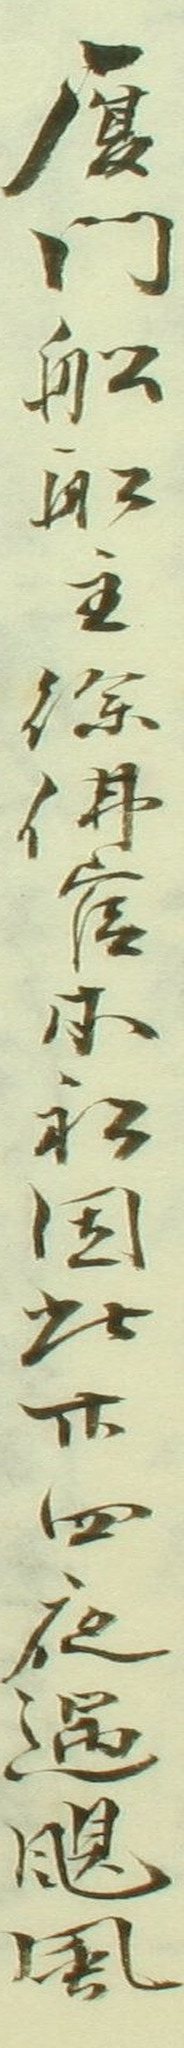厦門船船主徐仏官木船因此廿四夜遇颶風
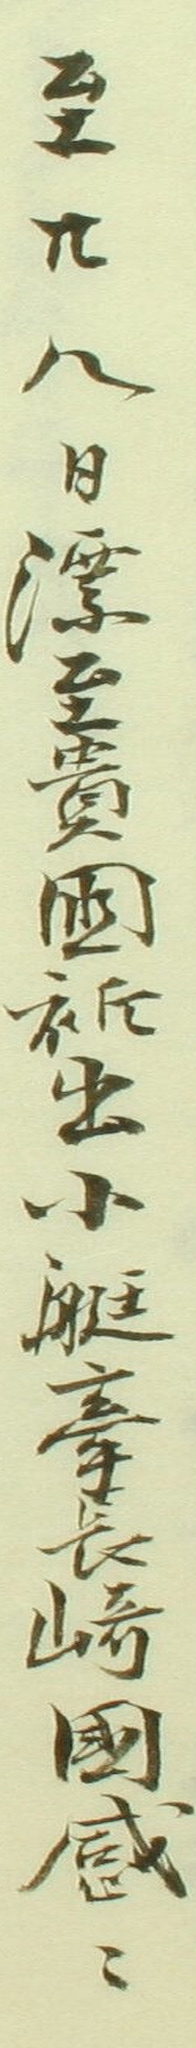至廿八日漂至貴国祈出小定艇牽長崎国感々
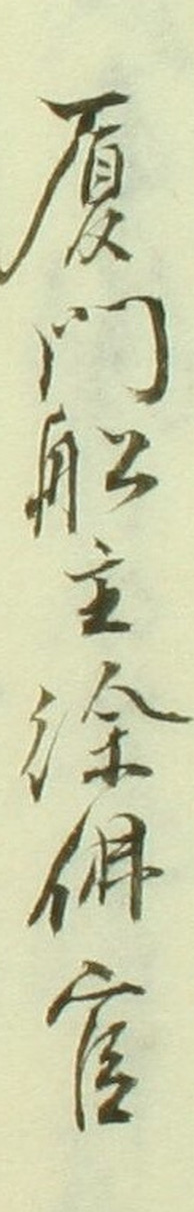厦門船主徐仏官
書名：異国船漂着記
